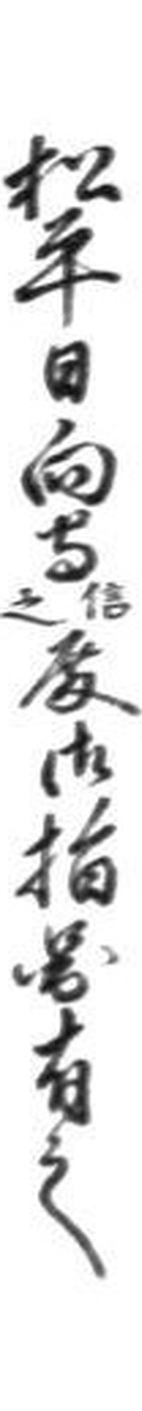松平日向守信之殿指図有之

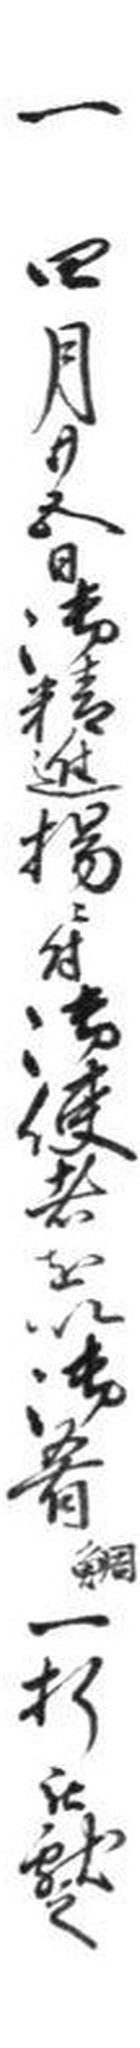一四月廿五日後精進揚ニ付御使者を以御肴鯛一折被献之
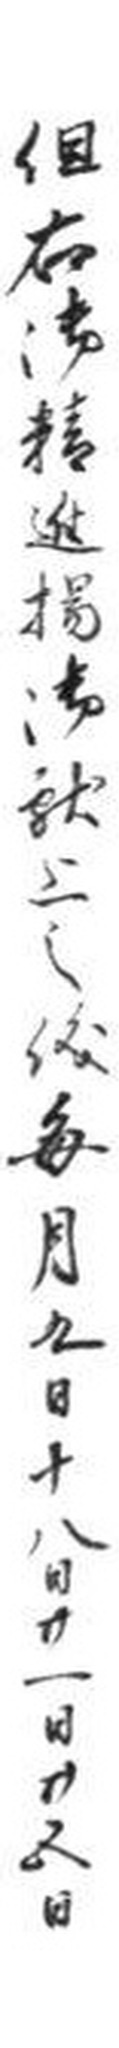但右御精進揚御献上之儀毎月九日十八日廿一日廿五日
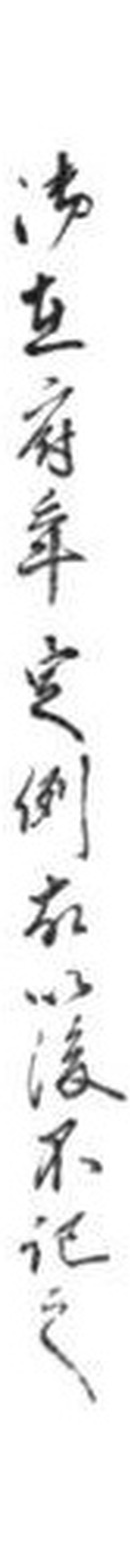御在府年定例故以後不記之
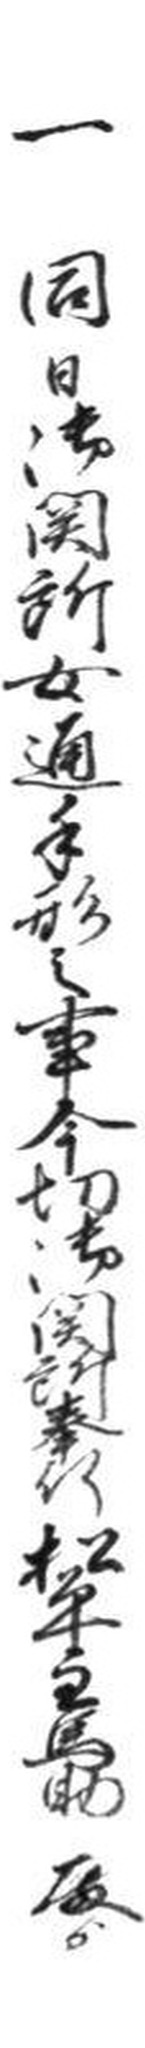一同日御関所女通手形之事今切御関所奉行松平主馬助殿ゟ
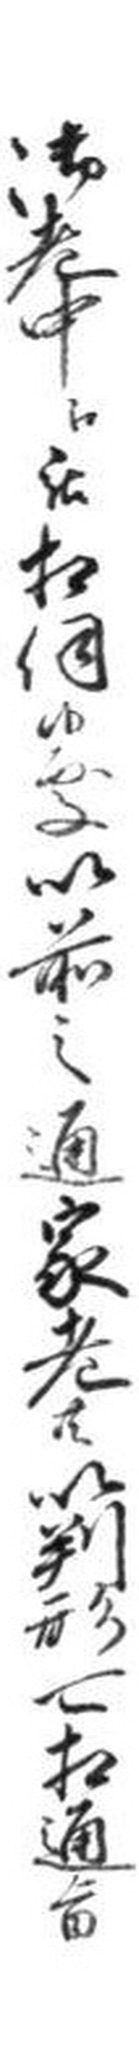御老中江被相伺候處以前之通家老共以判形可相通旨
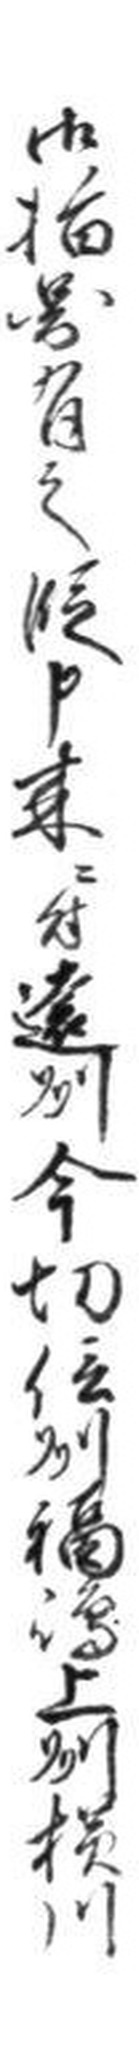御指図有之段申来ニ付遠州今切信州福嶋上州横川
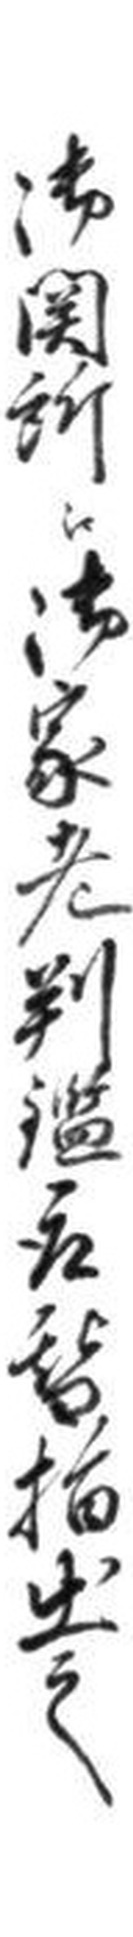御関所江御家老判鑑取替指出之
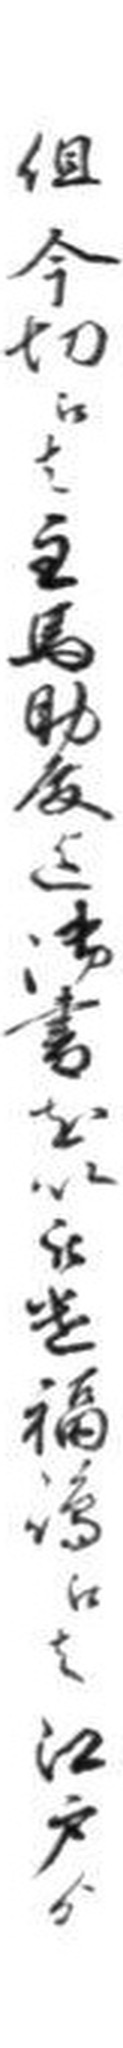但今切江者主馬助殿迄御書を以被遣福嶋江者江戸ゟ
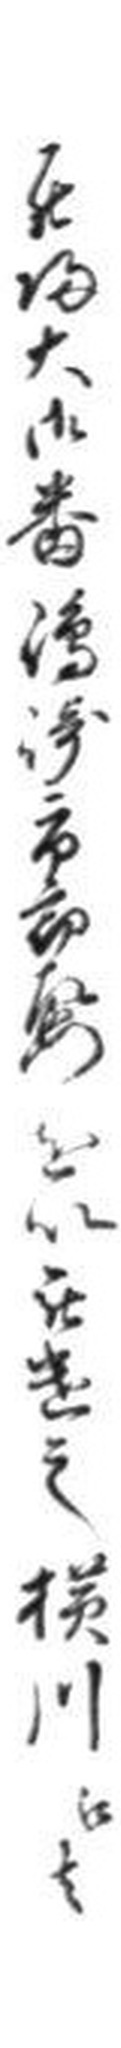罷帰大御番嶋崎市郎左衛門を以被遣之横川江者
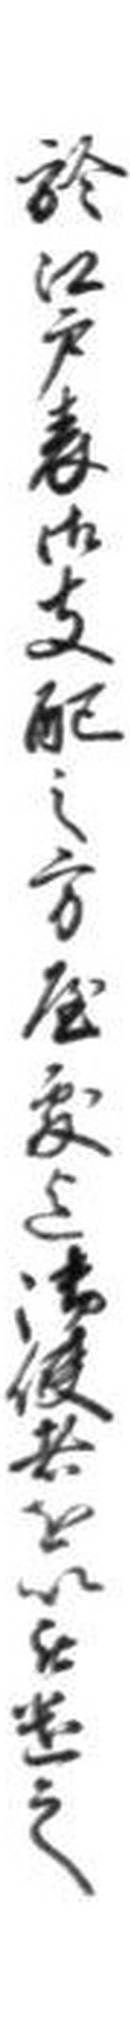於江戸表御支配之方屋敷迄御使者を以被遣之
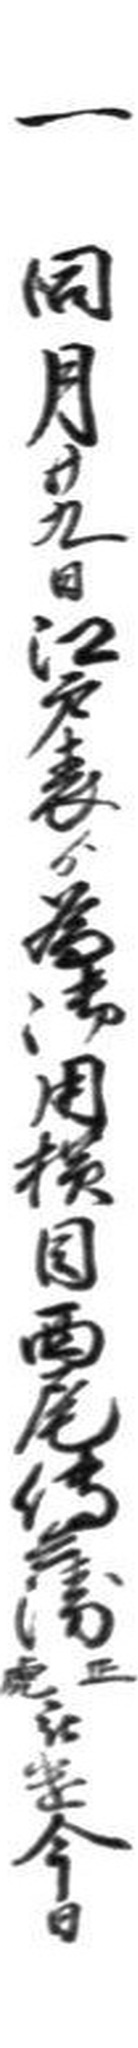一同月廿九日江戸表ゟ為御用横目西尾伝兵衛正虎被遣今日
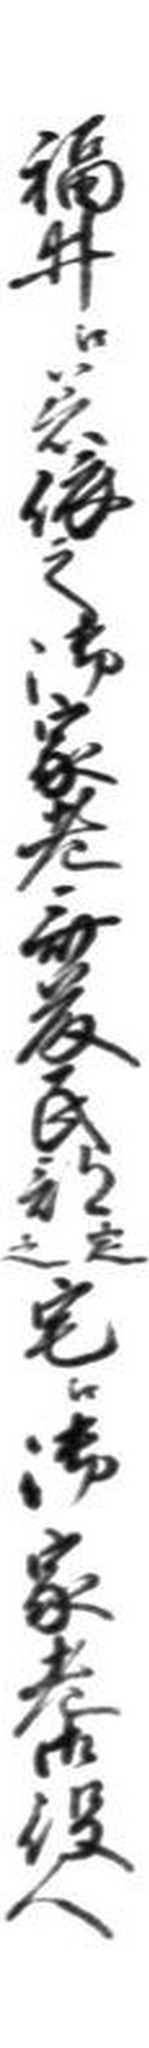福井江着依之御家老斎藤民部定之宅江御家老御役人
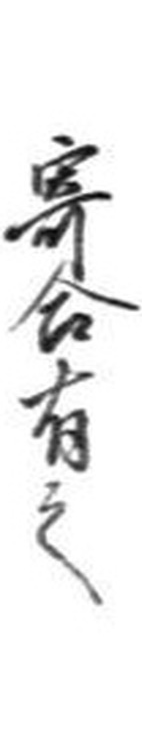寄合有之
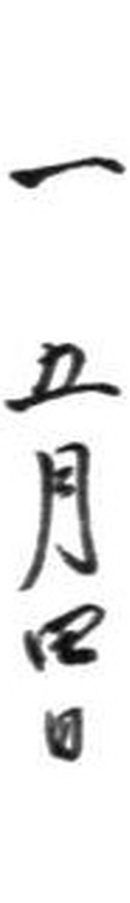一五月四日
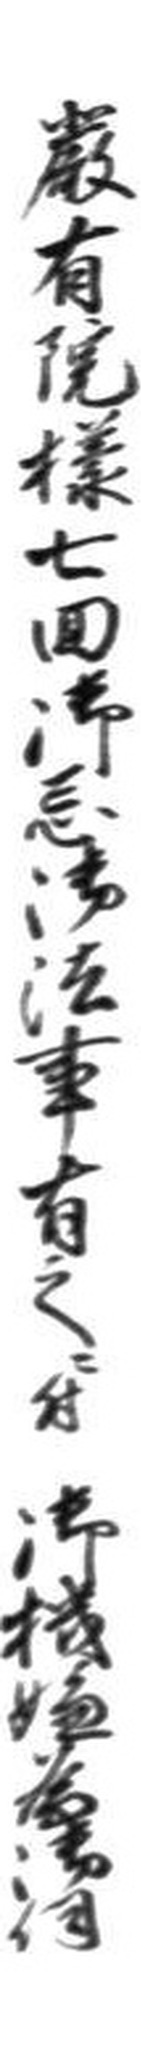厳有院様七回御忌御法事有之ニ付御機嫌為御伺
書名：家譜 十六 吉品公 従貞享三年閏三月到同四年
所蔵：福井県文書館 Fukui Prefectural Archives
